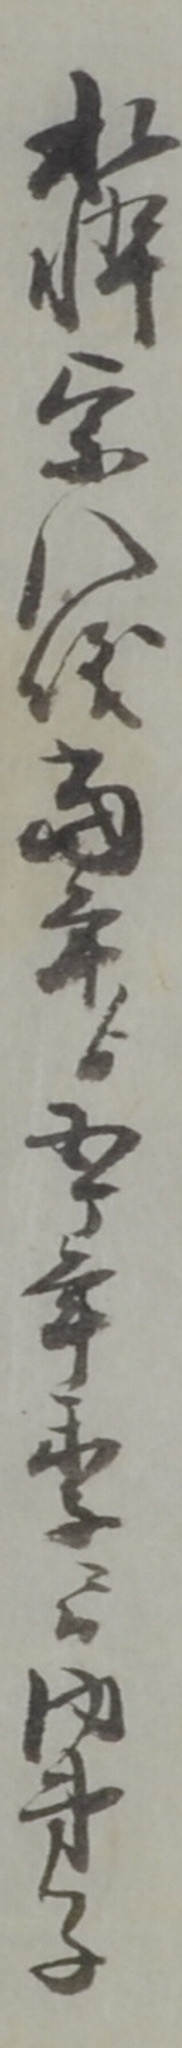私忰宗八儀当年ゟ五ヶ年季ニ而内弟子
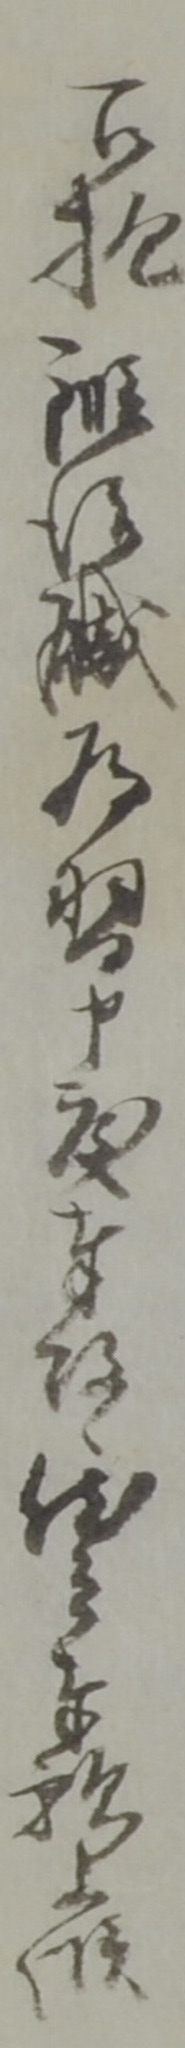召抱鍛冶職為習申度奉存候依之奉願上候
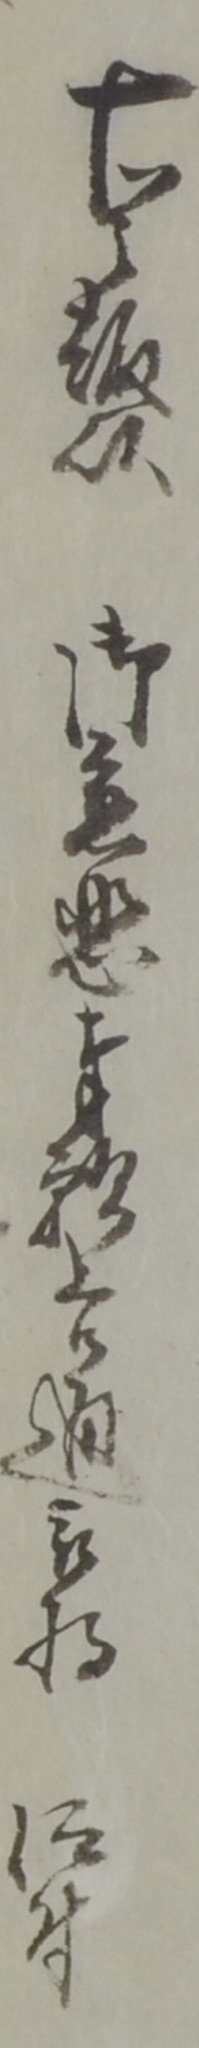右之趣以御慈悲奉願上候通被為仰付
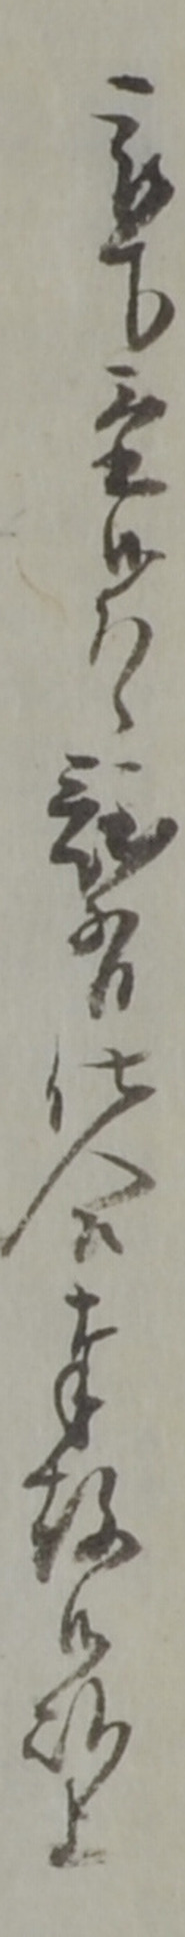被下置候ハヽ難有仕合奉存候以上
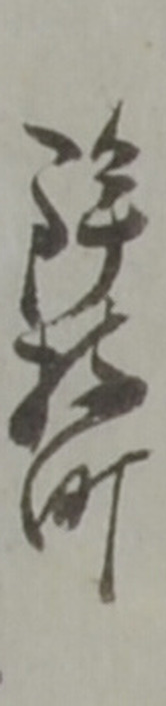鉾持町
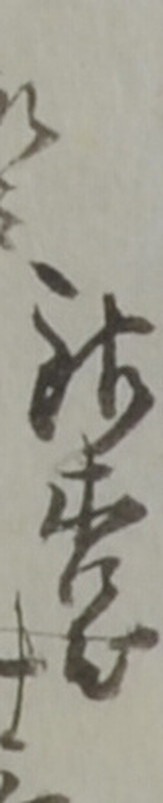銀杏屋
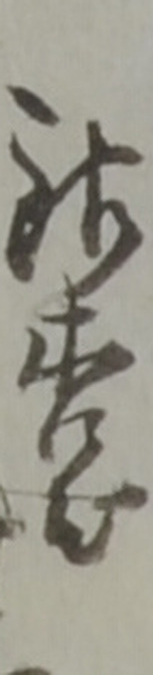銀杏屋
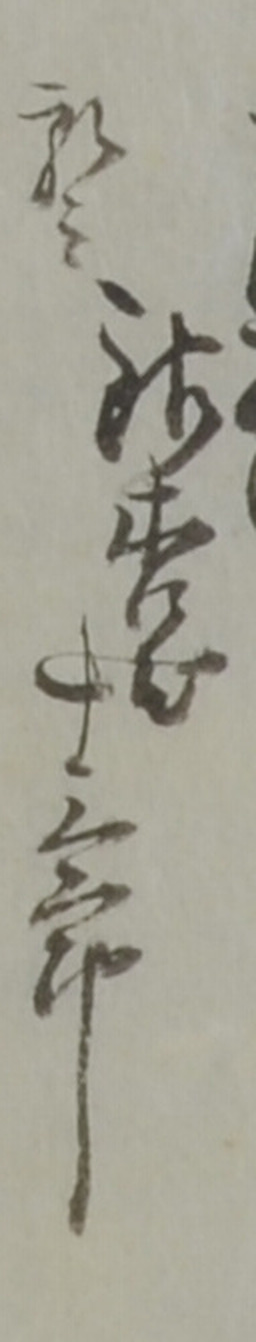願主十三郎
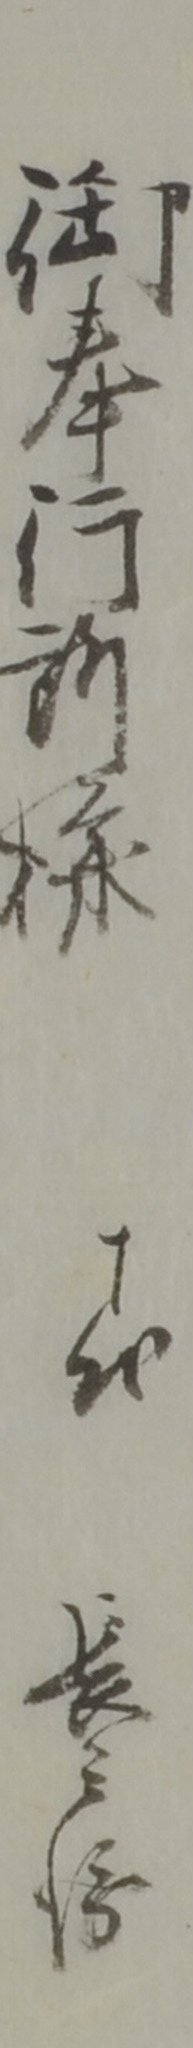御奉行所様丁代長兵衛
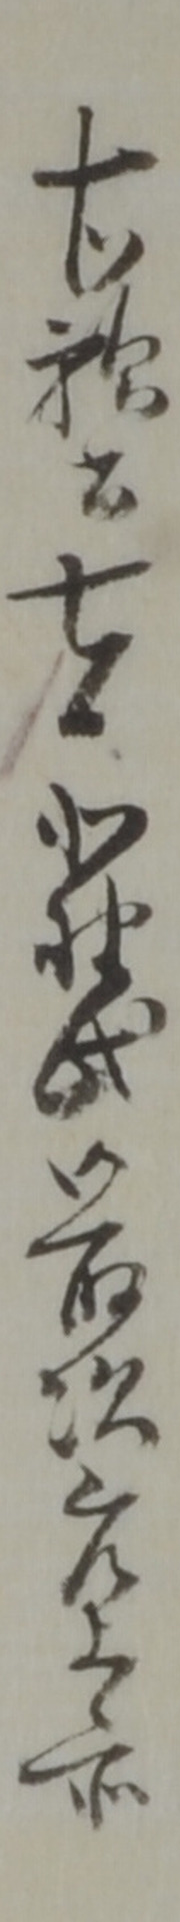右願書七日北野氏御取次差上候所
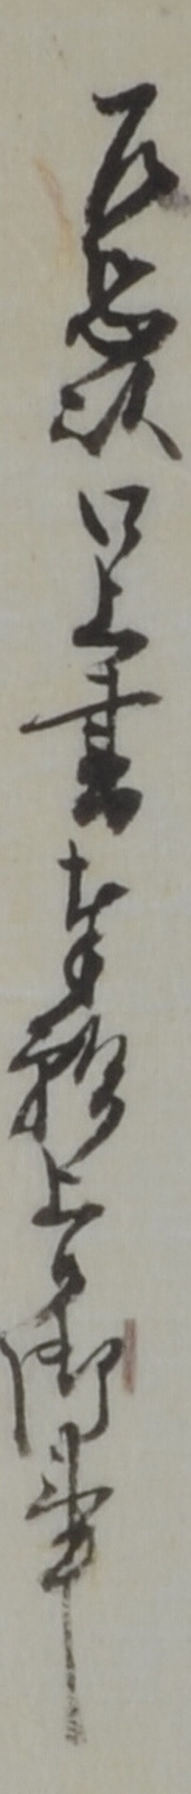乍恐以口上書奉願上候御事
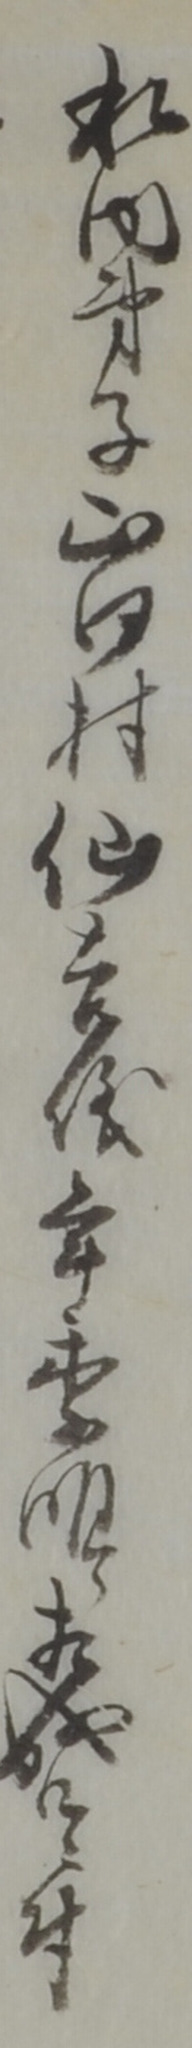私内弟子山田村仙吉儀年季御明ヶ相成候ニ付
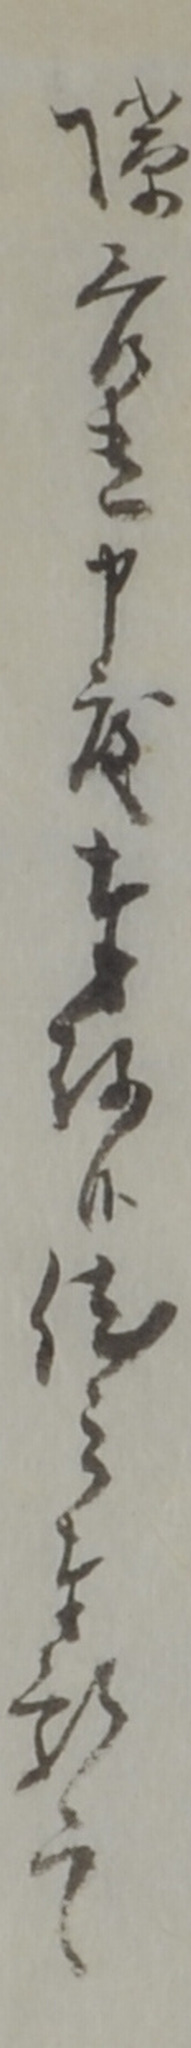隙差遣申度奉存候依之奉願上候
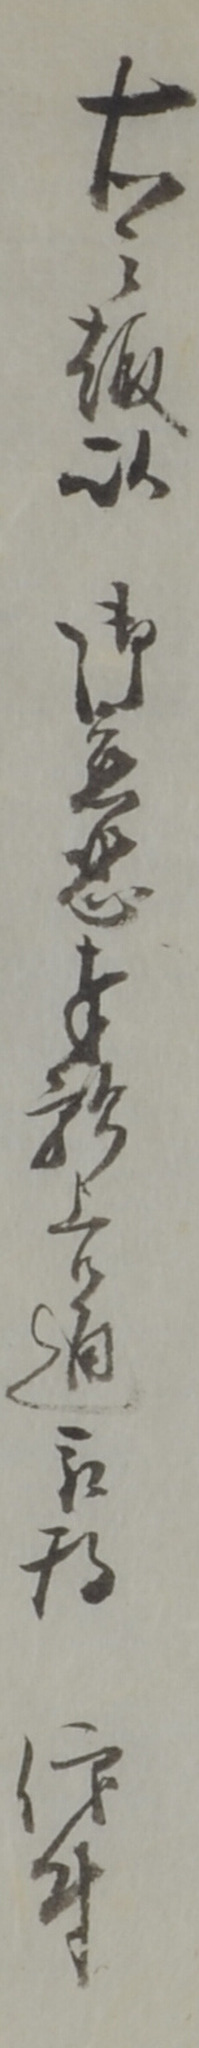右之趣以御慈悲奉願上候通被為仰付
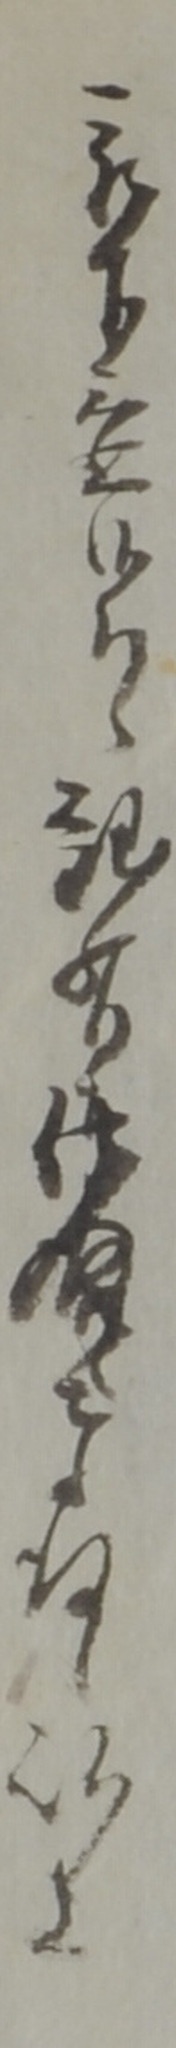被下置候ハヽ難有仕合奉存候以上
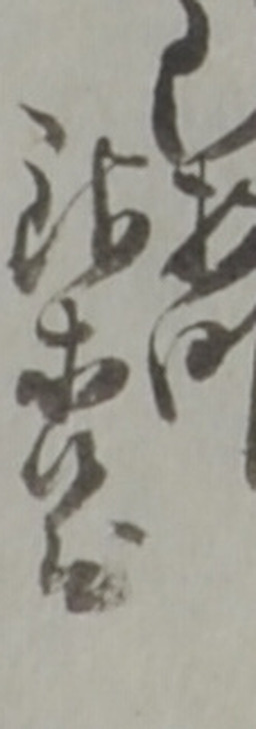銀杏屋
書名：諸願書控簿
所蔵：伊那市立高遠町図書館・合同会社AMANE
